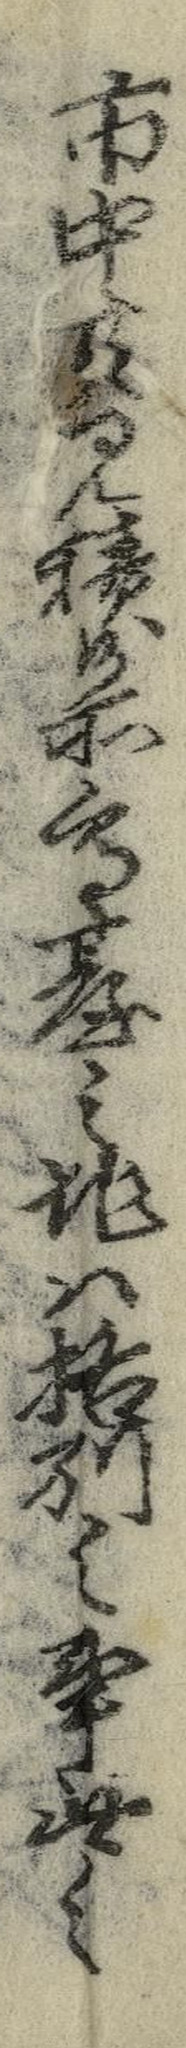市中共見積候所高台の地は格別の事無之
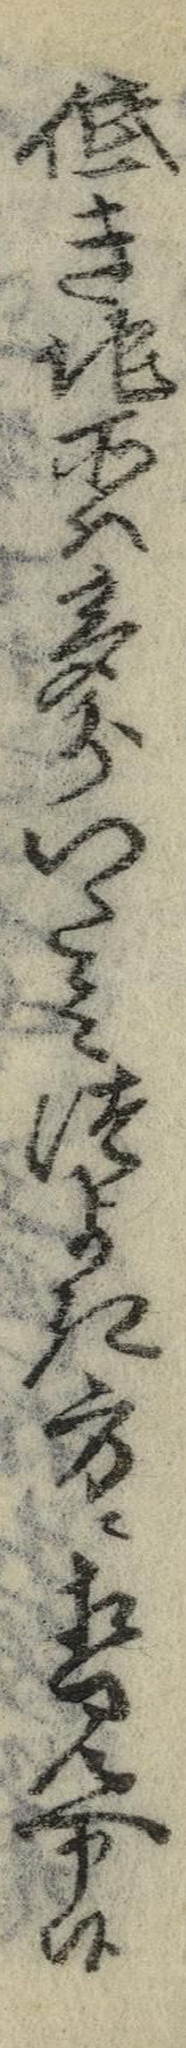低き地所は多分いたみつよき方に相見へ申候
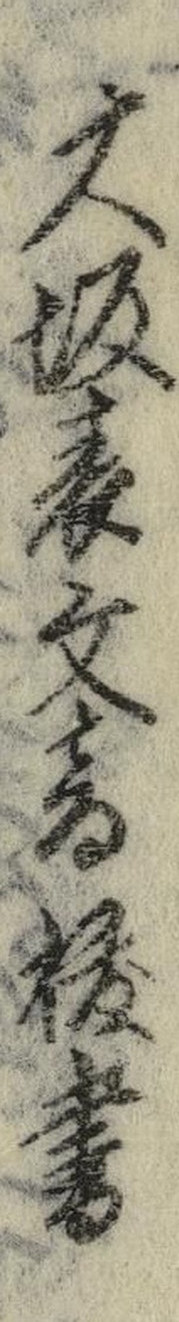大坂表文音抜書
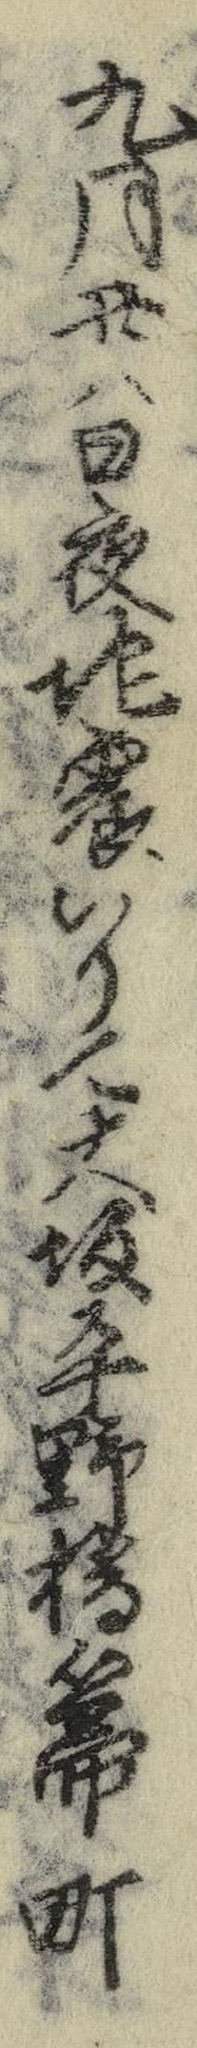九月廿八日夜地震いりて大坂平野橋箒町
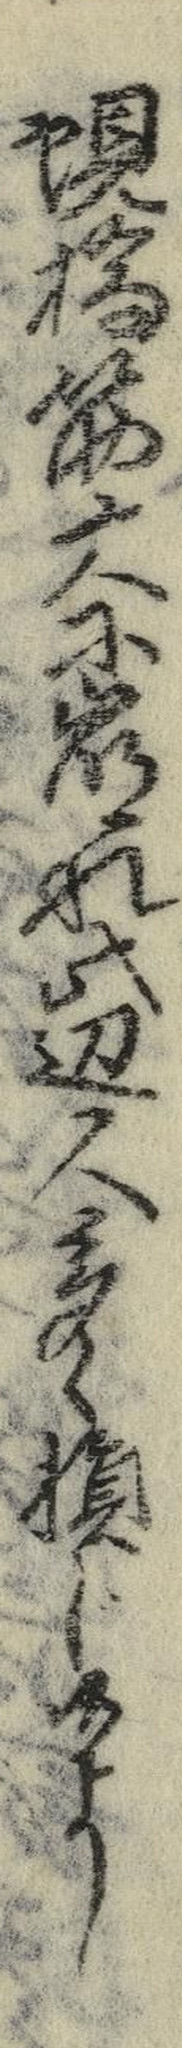蜆橋筋大に崩れ此辺人多く損じ候よし
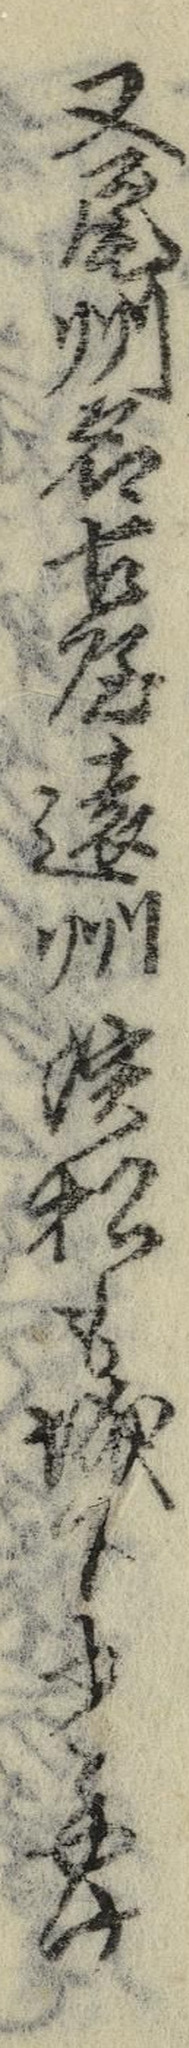又尾州名古屋遠州浜松も城下少しやけ
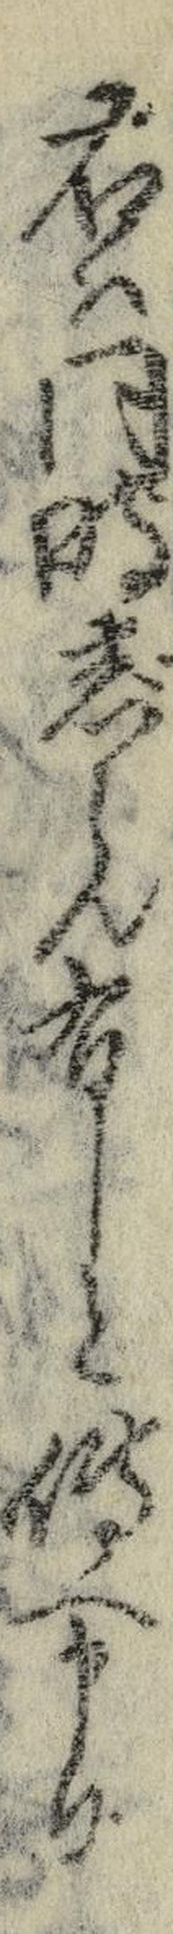右は同時じしん有之と伝へ申候
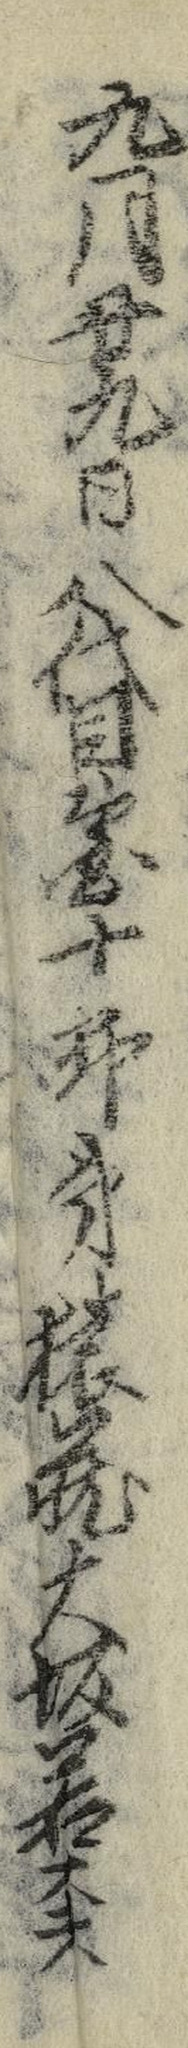九月廿九日八代目団十郎弟猿蔵大坂若大夫
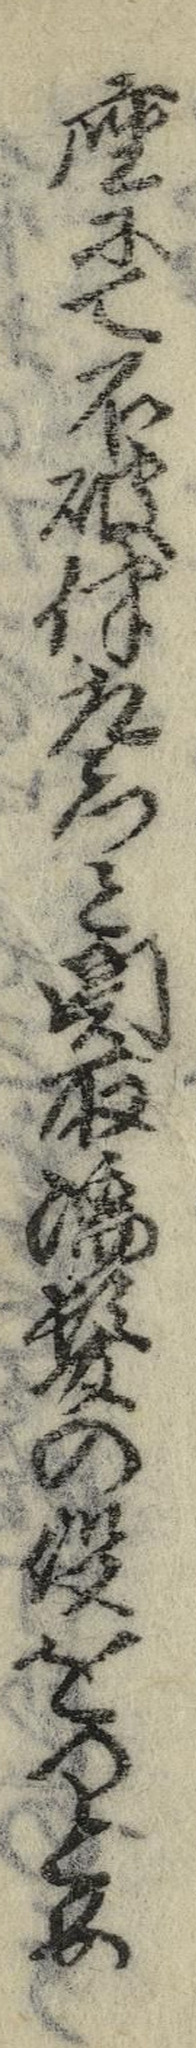座にて不破伝左衛門と関取濡髪の役をつとめ
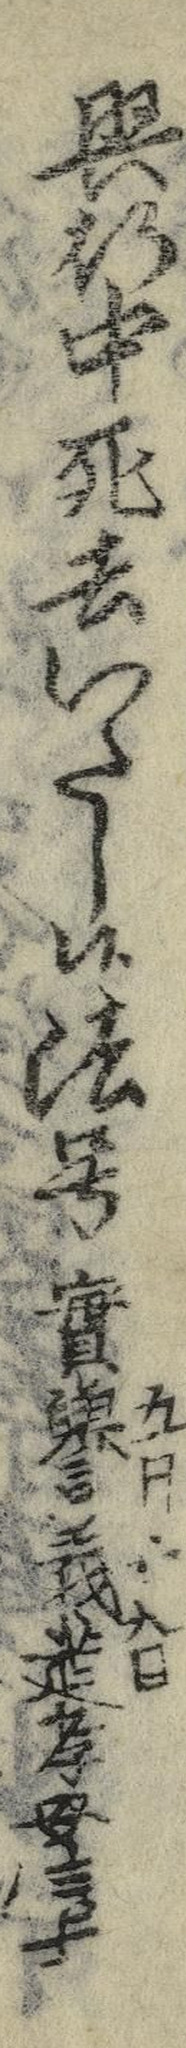興行中死去いたし候法号実誉義筵孝安信士
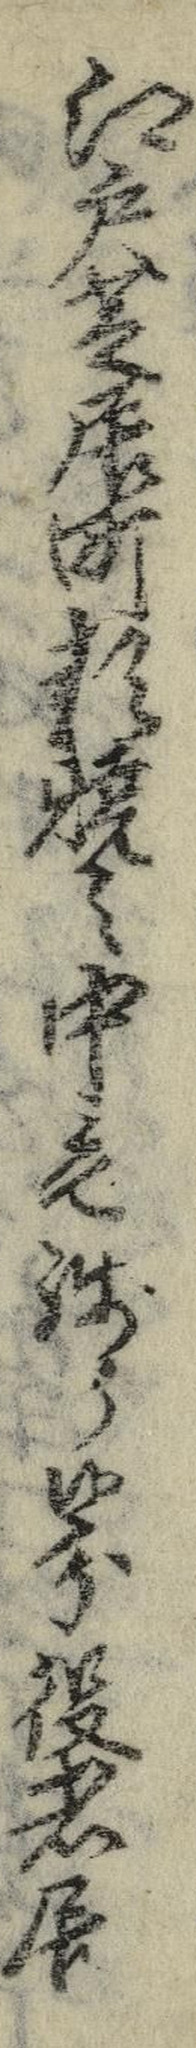江戸芝居町類焼の中にて残り候分役者居
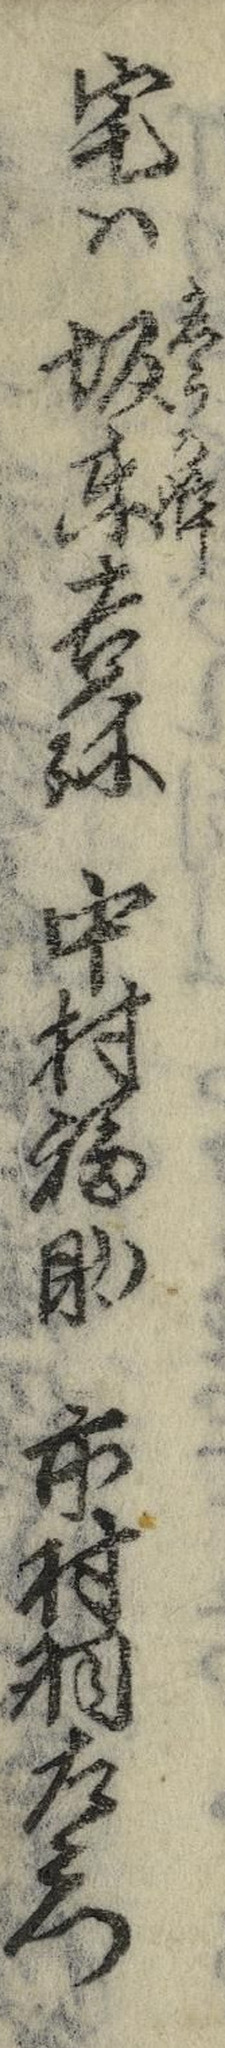宅ハ坂東吉弥中村福助市村羽左衛門
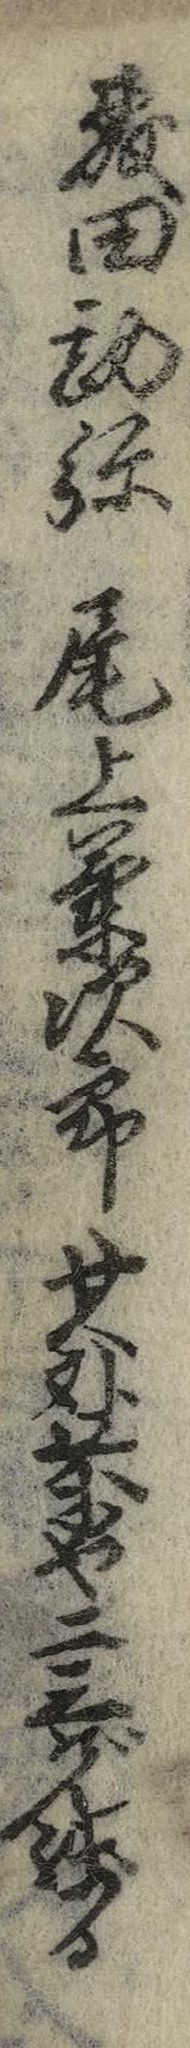森田勘弥尾上菊次郎其外茶や二三げん残る
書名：地震類焼場所明細書之写　安政二卯年十月二日夜四ツ時過　御府内御屋敷方市中共、并街道筋近郷聞書
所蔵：東京大学地震研究所図書室 Earthquake Research Institute Library, The University of Tokyo, JAPAN
